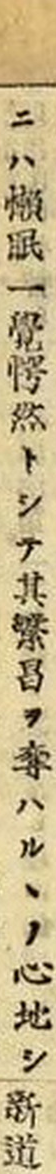ニハ懶眠一覺愕然トシテ其繁昌ヲ奪ハルヽノ心地シ
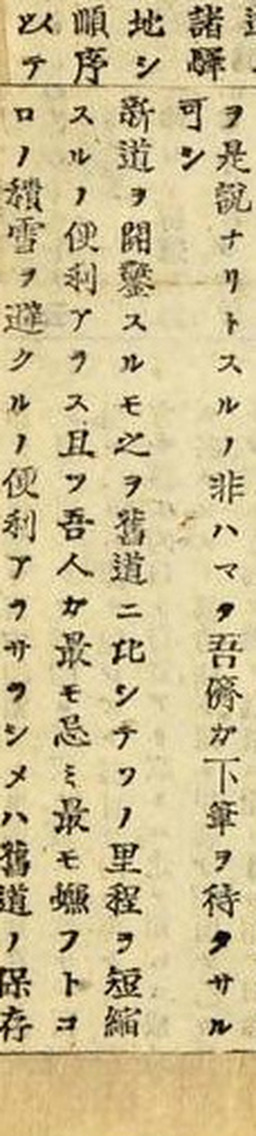新道ヲ開鑿スルモ之ヲ舊道ニ比シテソノ里程ヲ短縮
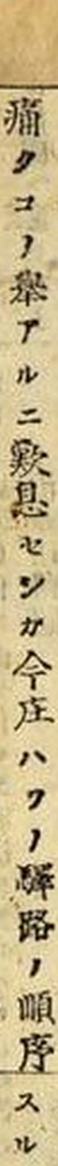痛クコノ擧アルニ歎息セシガ今庄ハソノ驛路ノ順序
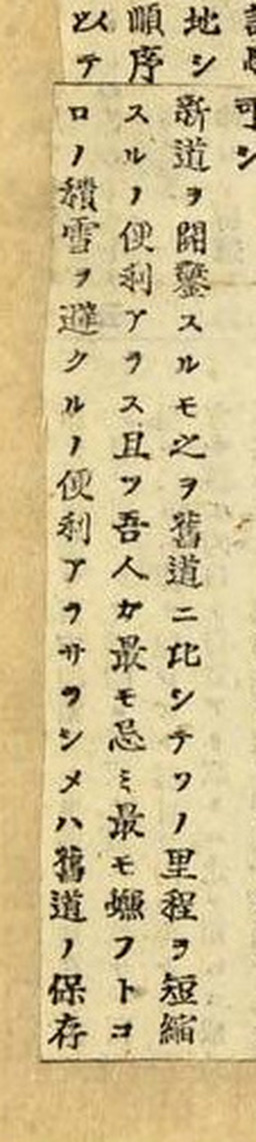スルノ便利アラス且ツ吾人ガ最モ忌ミ最モ嫌フトコ
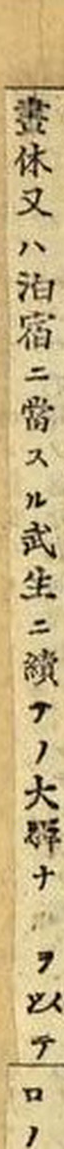晝休又ハ泊宿ニ當スル武生ニ續テノ大驛ナルヲ以テ
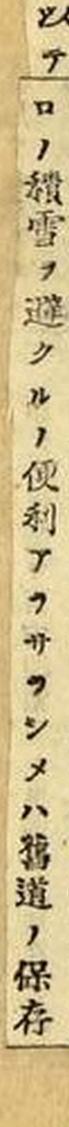ロノ積雪ヲ避クルノ便利アラサラシメハ舊道ノ保存

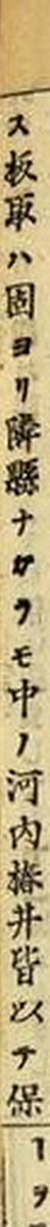ス板取ハ固ヨリ隣縣ナガラモ中ノ河内椿井皆以テ保
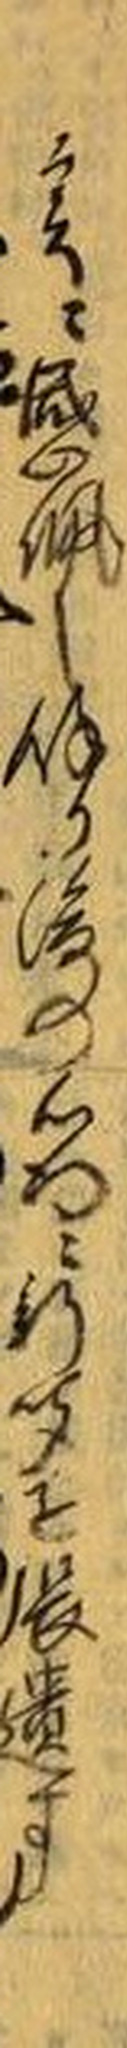実ニ感佩之余り後の心得ニ新聞を張遺す
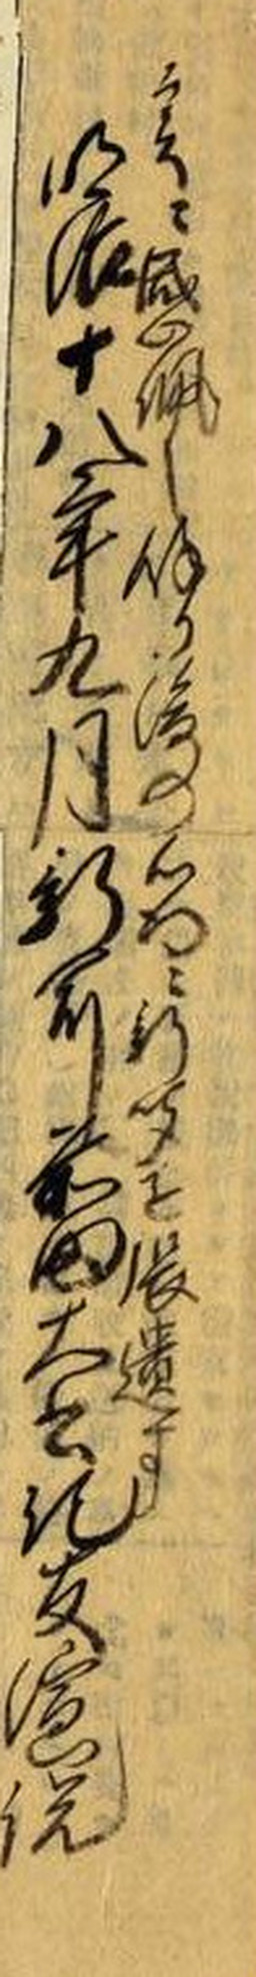明治十八年九月新聞前田大書記官演説
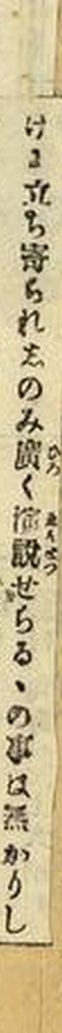けに立ち寄られしのみ広く演説せらるゝの事は無かりし
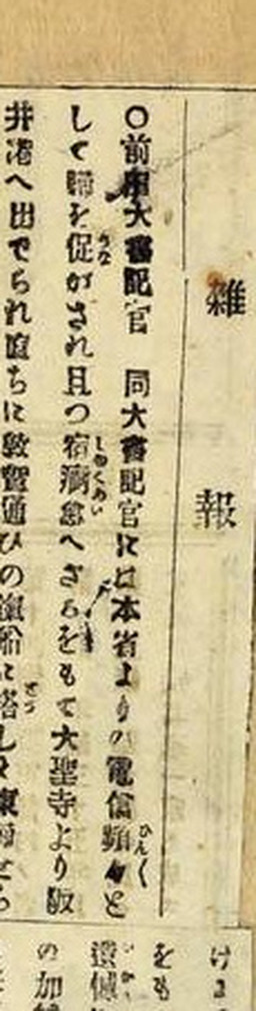〇前田大書記官同大書記官には本省より電信頻々と
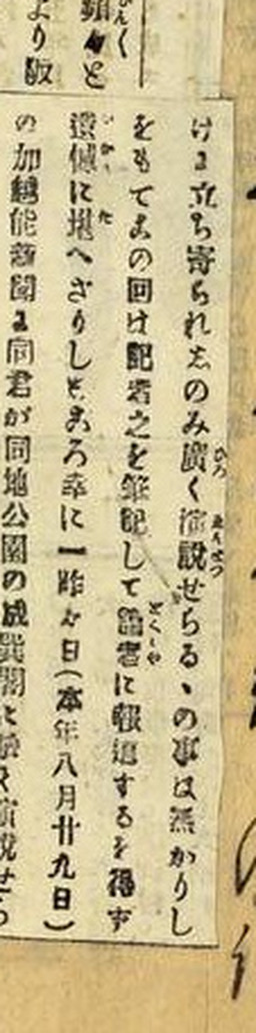をもてこの回は記者之を筆記して読者に報道するを得ず
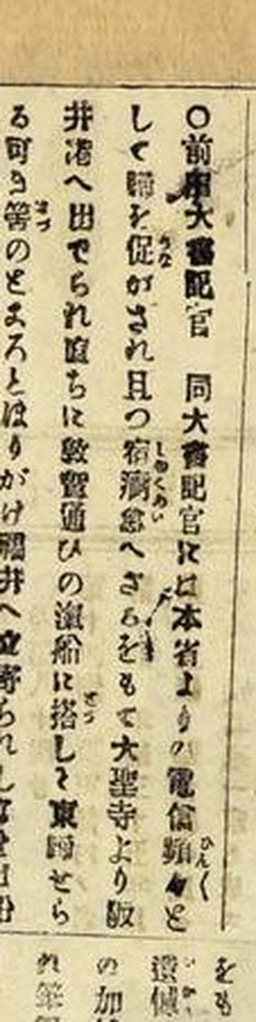して帰を促がされ且つ宿痾癒へざるをもて大聖寺より阪
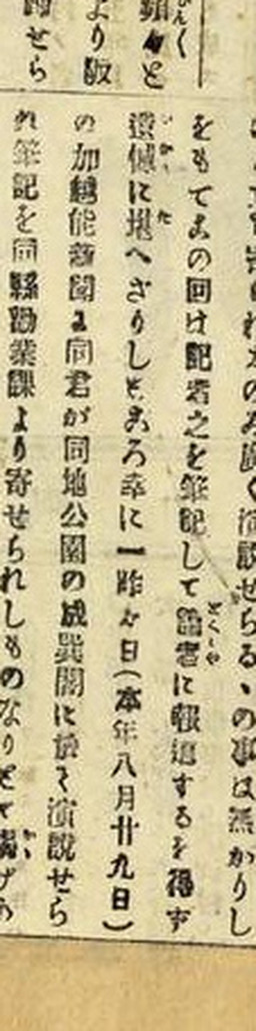遺憾に堪へざりしところ幸に一昨々日本年八月廿九日
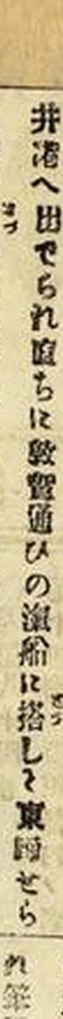井港へ出でられ直ちに敦賀通ひの汽船に搭して東帰せら
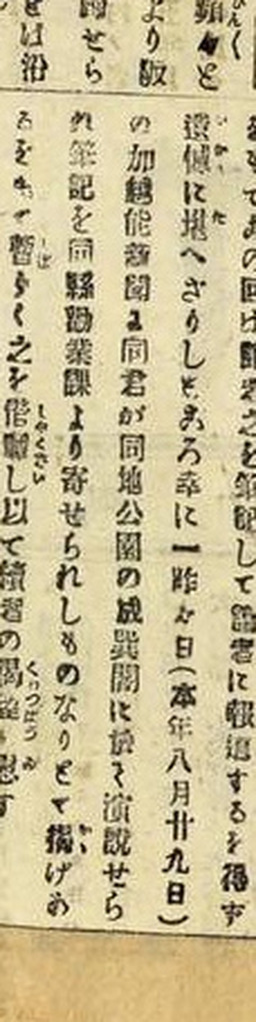の加越能新聞に同君が同地公園の成巽閣に於て演説せら
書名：温古集 五巻
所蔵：福井県文書館 Fukui Prefectural Archives
